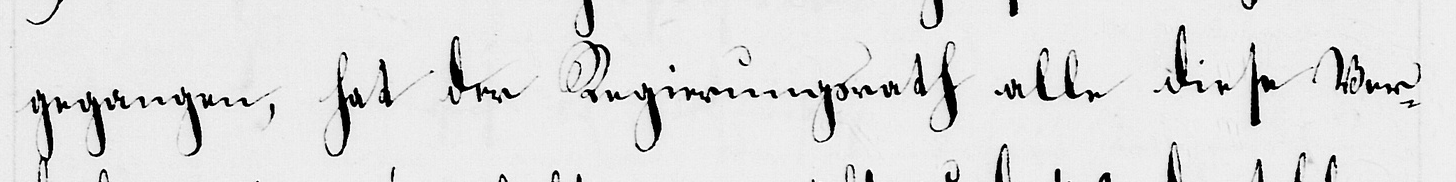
gegangen, hat der Regierungsrath alle diese Ver¬
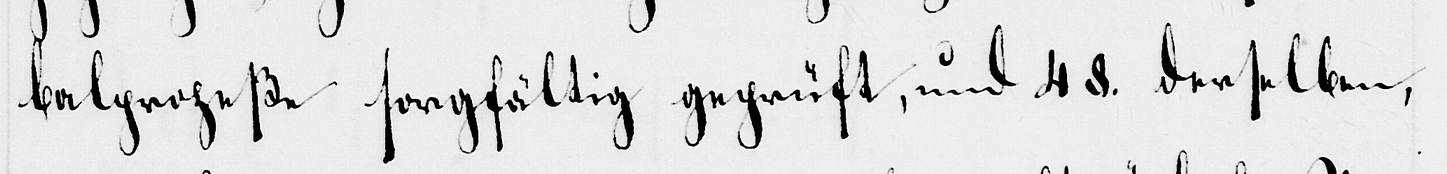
balprozeße sorgfältig geprüft, und 48. derselben,
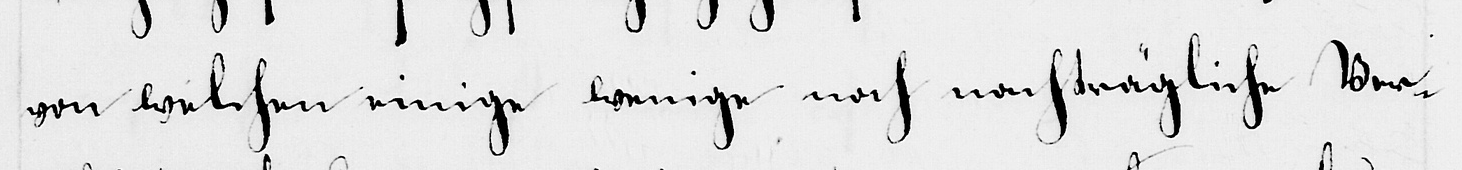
von welchen einige wenige noch nachträgliche Ver¬
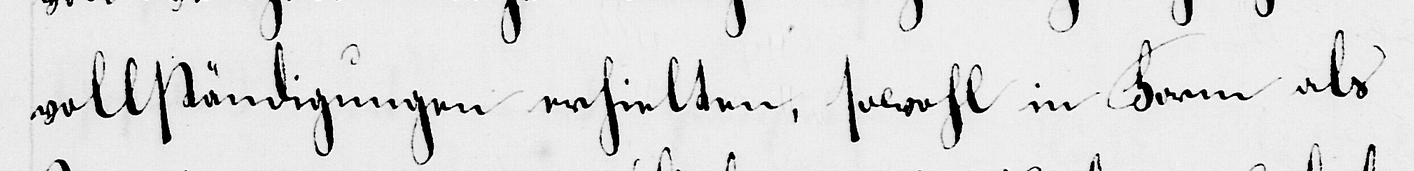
vollständigungen erhielten, sowohl in Form als
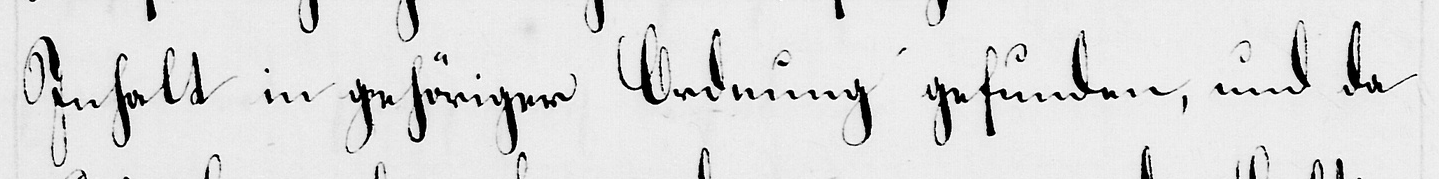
Inhalt in gehöriger Ordnung gefunden, und da
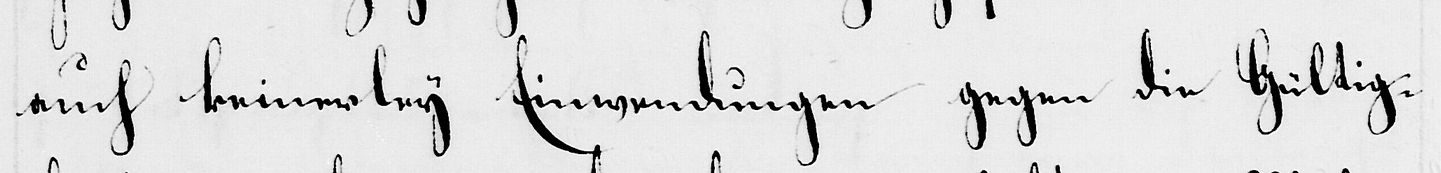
auch keinerley Einwendungen gegen die Gültig¬
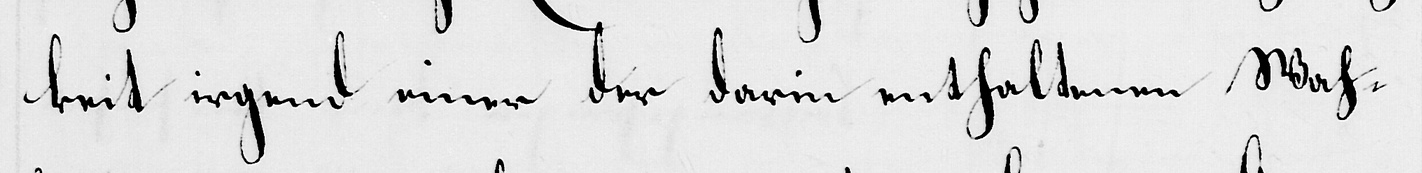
keit irgend einer der darin enthaltenen Wah¬
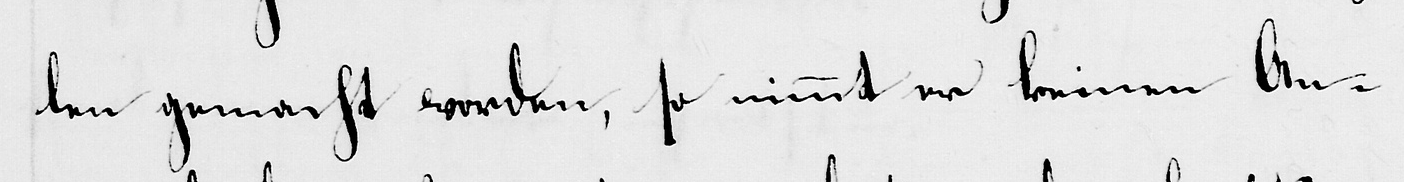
len gemacht worden, so nimmt er keinen An¬
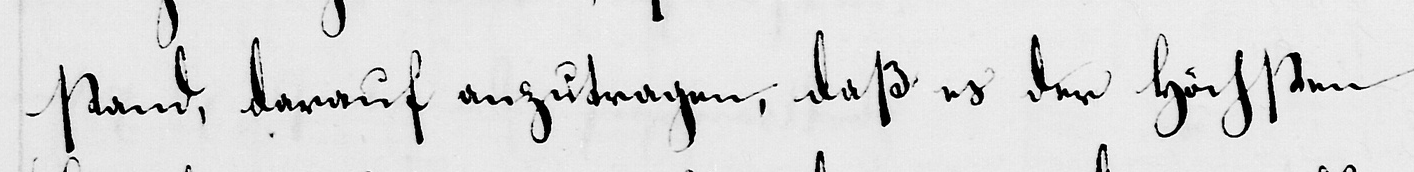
stand, darauf anzutragen, daß es der Höchsten
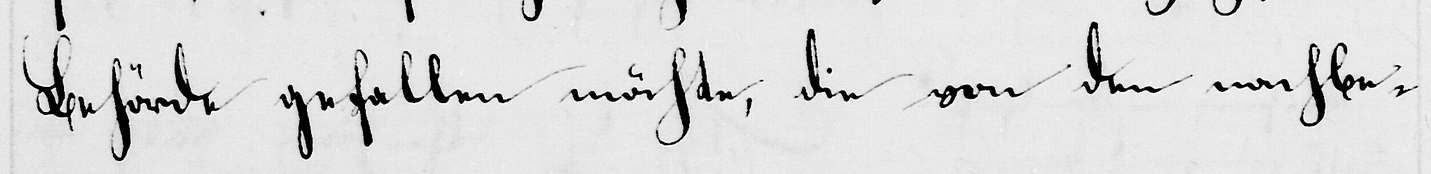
Behörde gefallen möchte, die von den nachbe-
